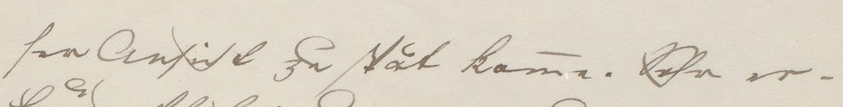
ser Ansicht zu spät komme. Sehr er-
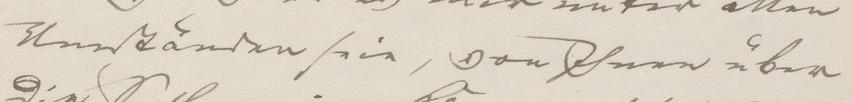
Umständen sein, von Ihnen über
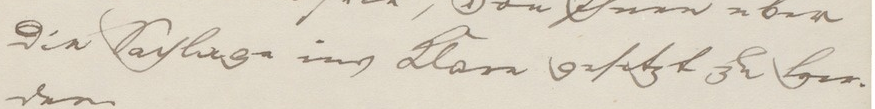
die Sachlage ins Klare gesetzt zu wer-
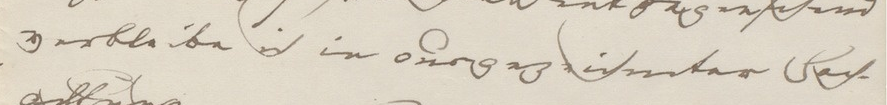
verbleibe ich in ausgezeichneter Hoch-
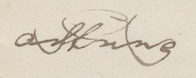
achtung.
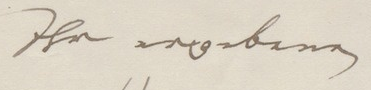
Ihr ergebener
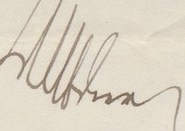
Escher
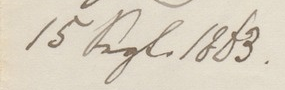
15 Sept. 1863.
